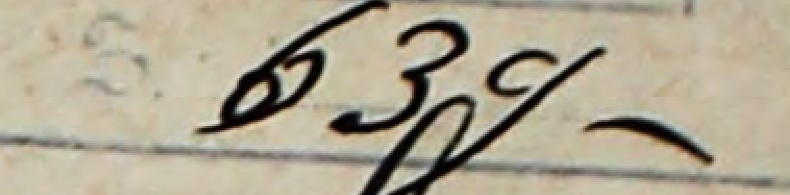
Z. 639
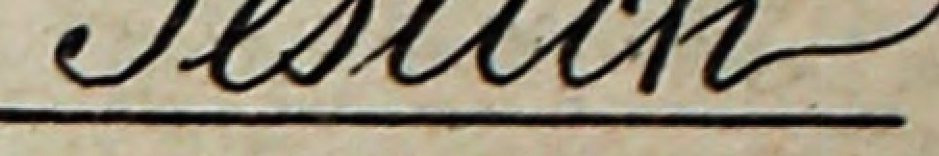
Gesuch
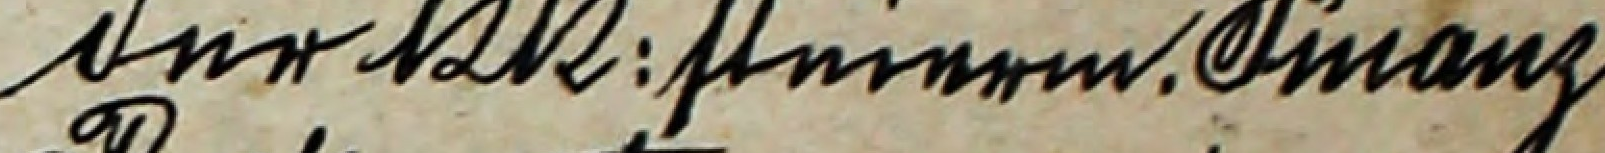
der kk: steierm. Finanz
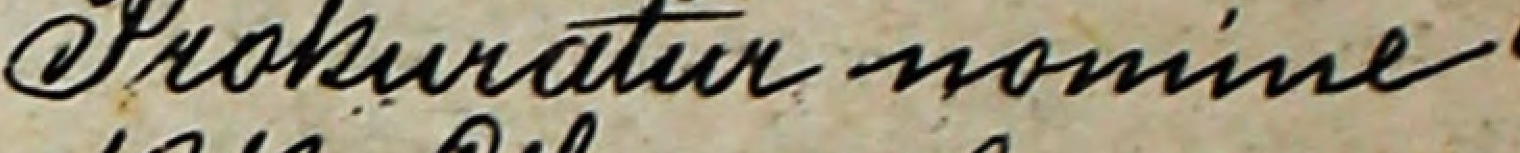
Prokuratur nomine
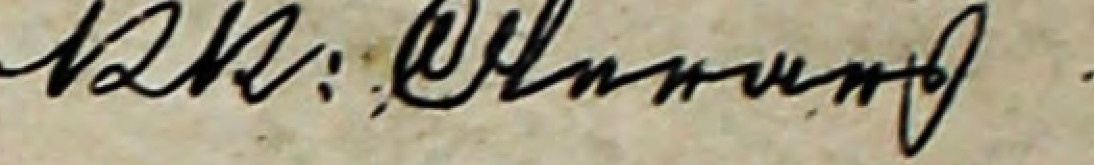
kk: Aerars
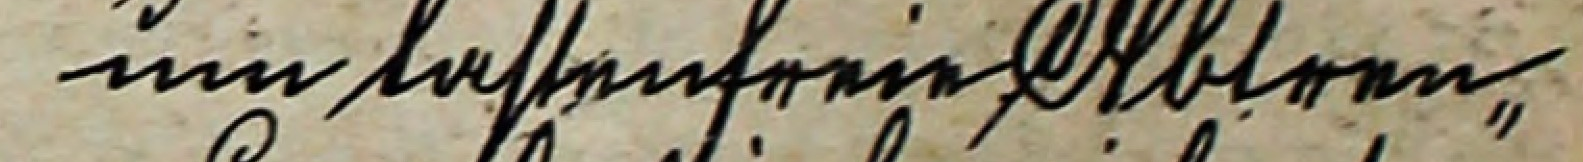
um lastenfreie Abtren„
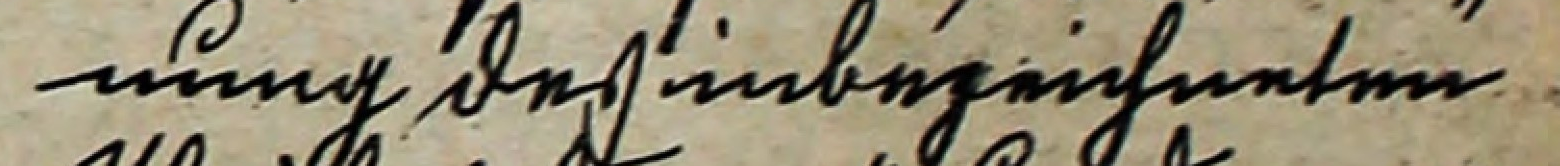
nung des inbezeichneten
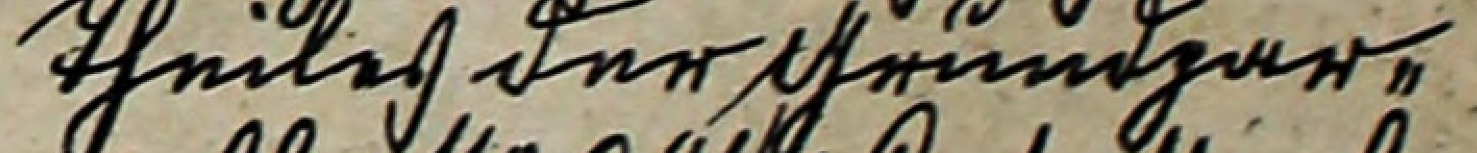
Theiles der Grundpar„
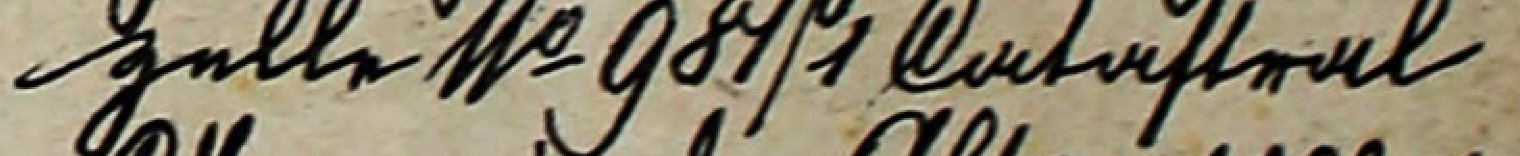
zelle No 981/1 Catastral
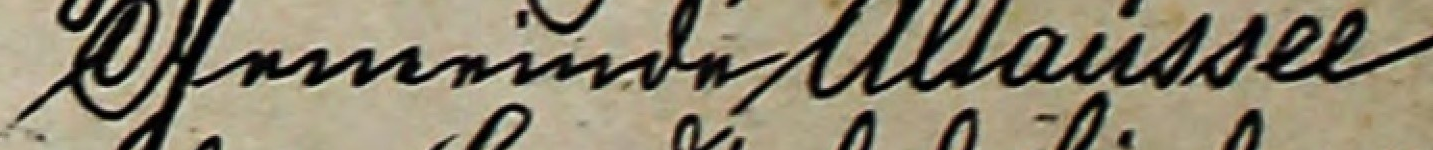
Gemeinde Altaussee
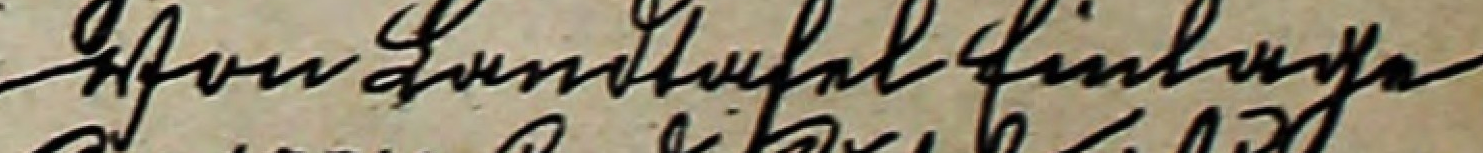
von Landtafel Einlage
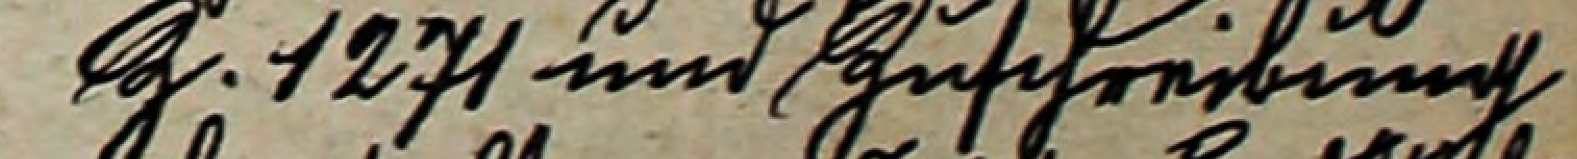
Z. 1271 und Zuschreibung
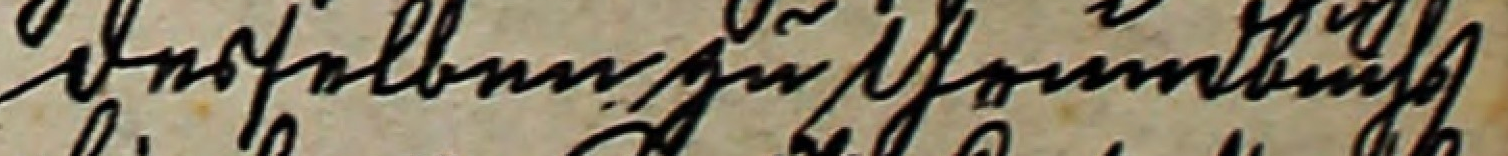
desselben zu Grundbuchs
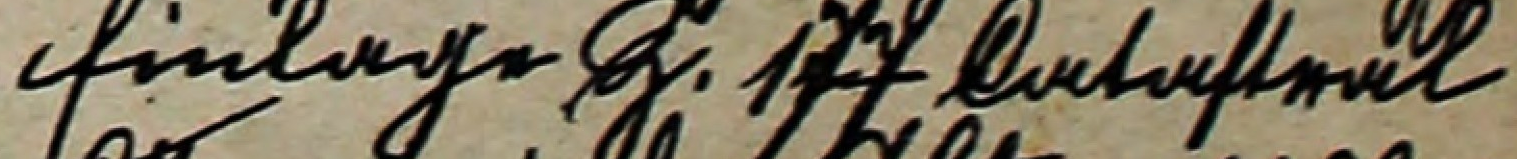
Einlage Z. 177 Catastral
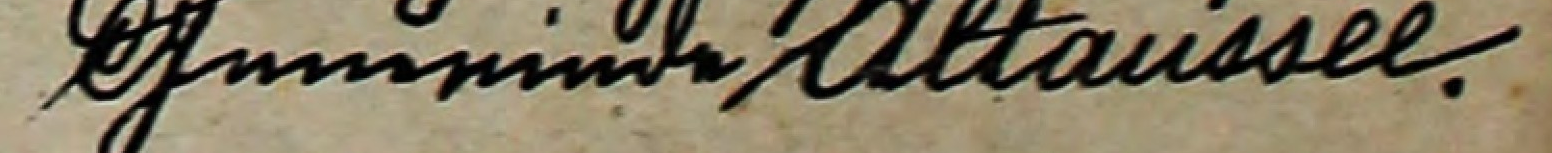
Gemeinde Altaussee.
